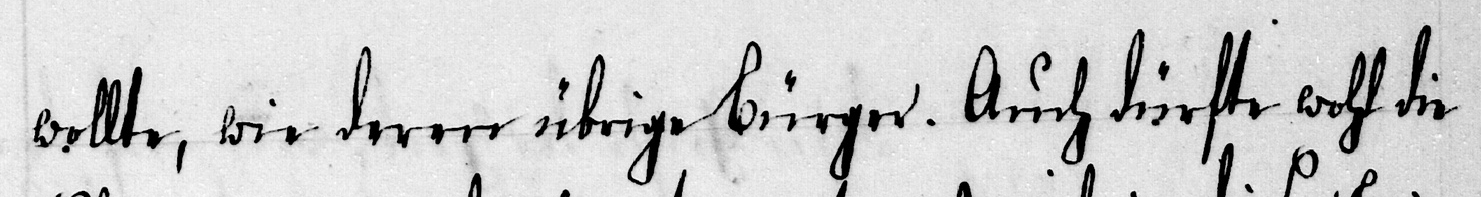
wollte, wie deren übrige Bürger. Auch dürfte wohl die
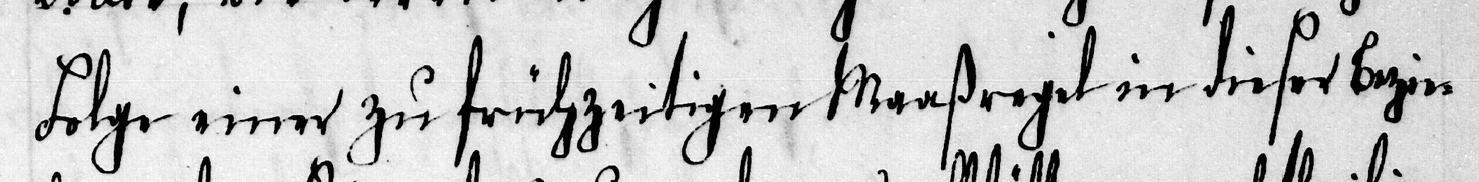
Folge einer zu frühzeitigen Maaßregel in dieser Bezie¬
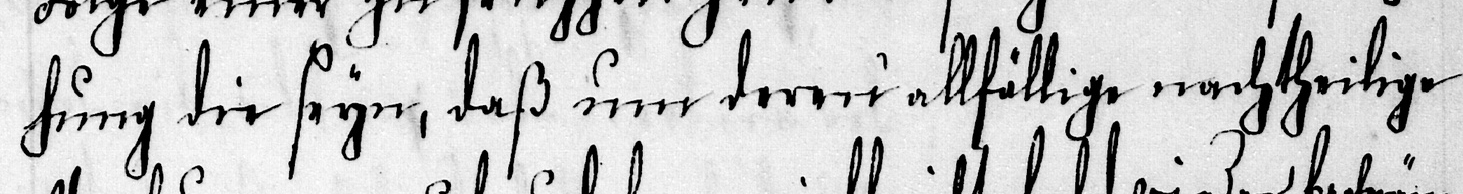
hung die seyn, daß um deren allfällige nachtheilige
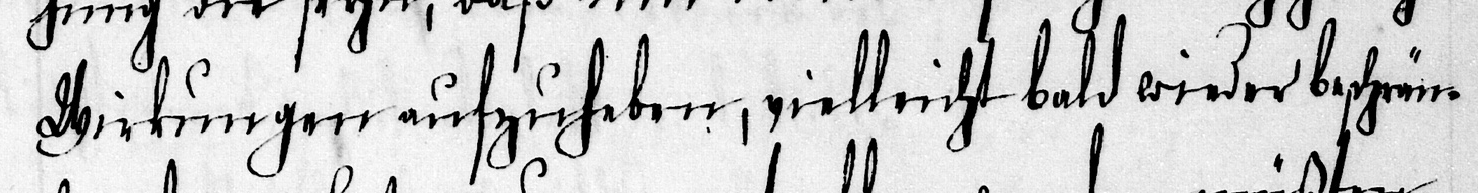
Wirkungen aufzuheben, vielleicht bald wieder beschrän¬
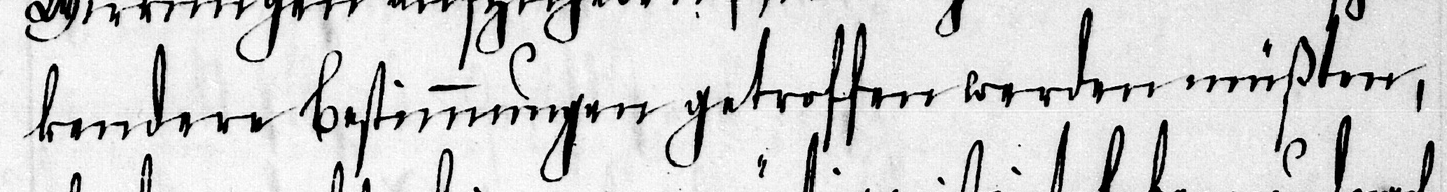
kendere Bestimmungen getroffen werden müßten,
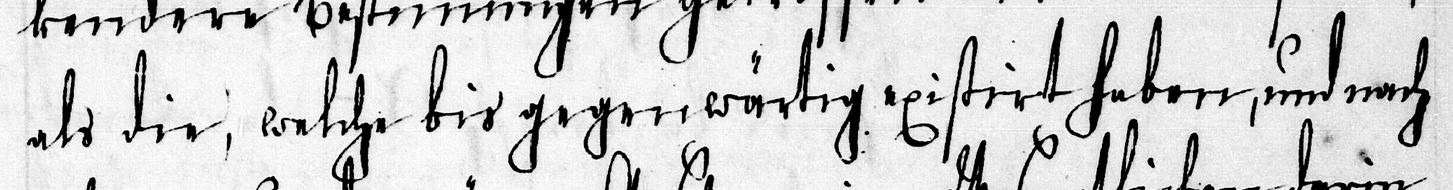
als die, welche bis gegenwärtig existirt haben, und nach
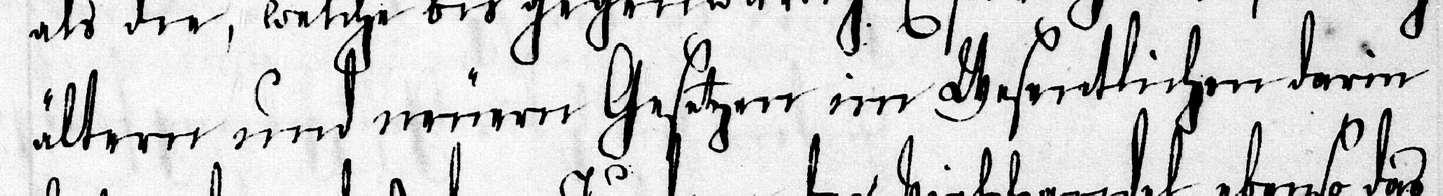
ältern und neuern Gesetzen im Wesentlichen darin
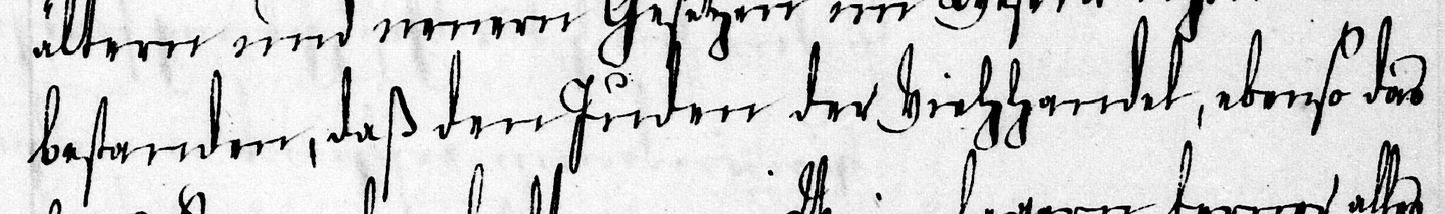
bestanden, daß den Juden der Viehhandel, ebenso das
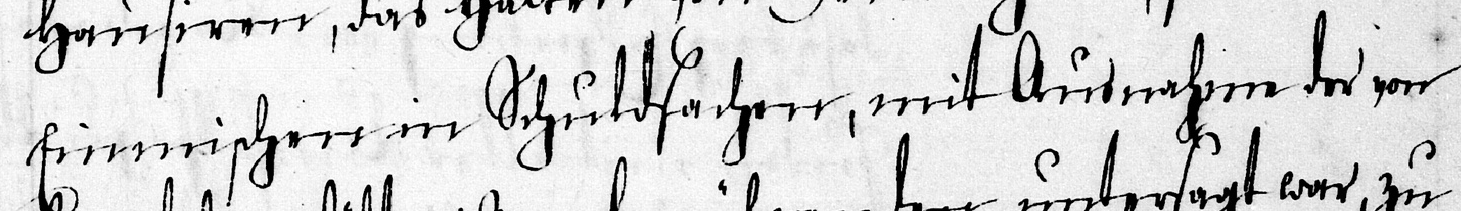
Einmischen in Schuldsachen, mit Ausnahme der von
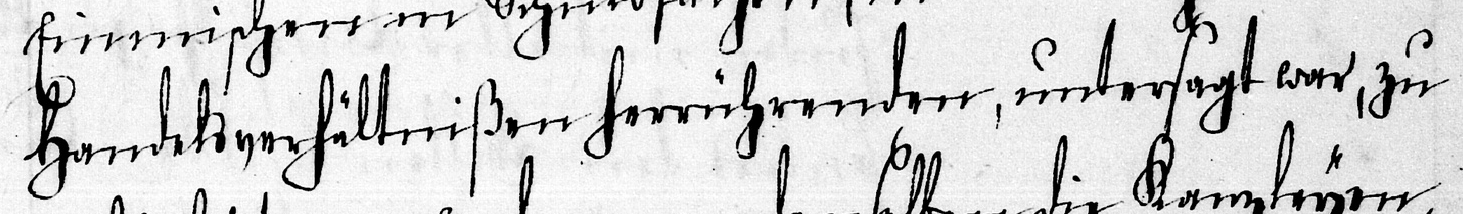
Handelsverhältnißen herrührenden, untersagt war, zu
